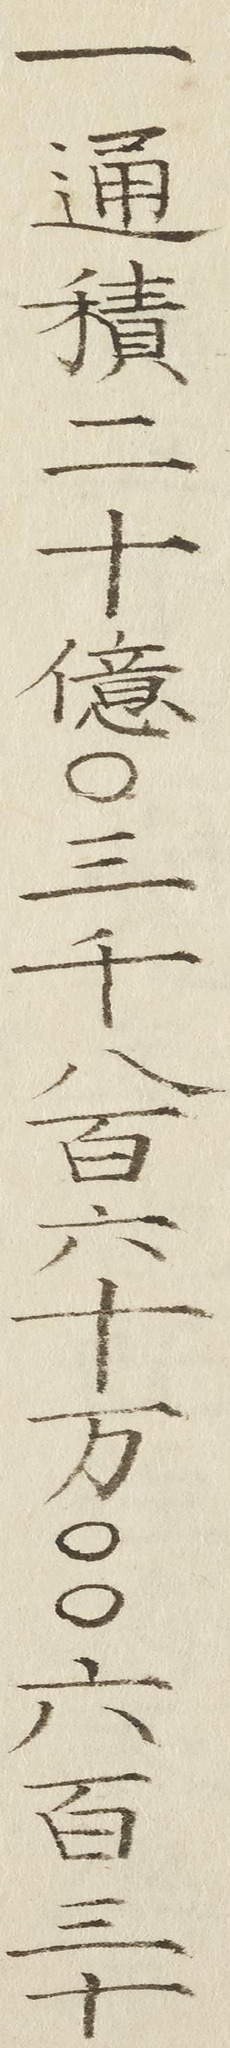一通積二十億〇三千八百六十五万〇〇六百三十
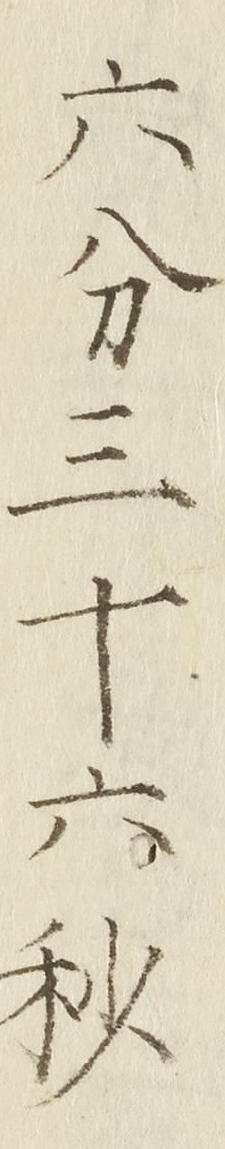六分三十六秒
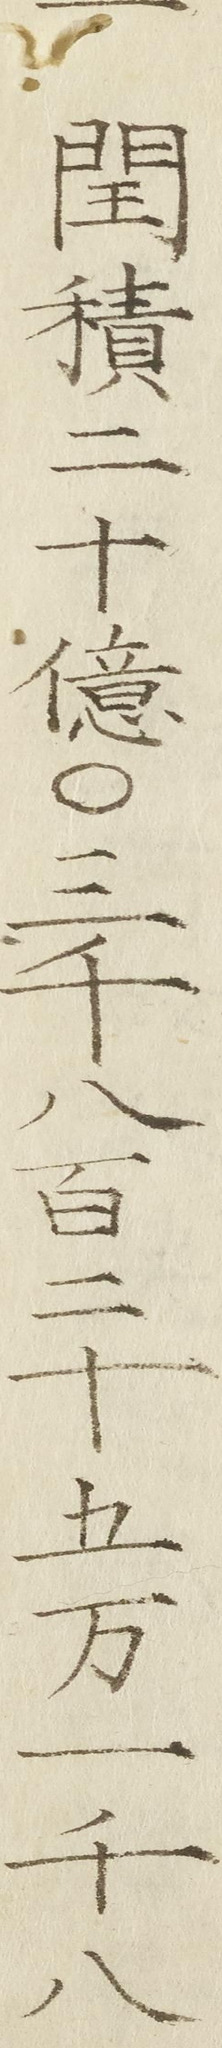一閏積二十億〇三千八百二十五万一千八
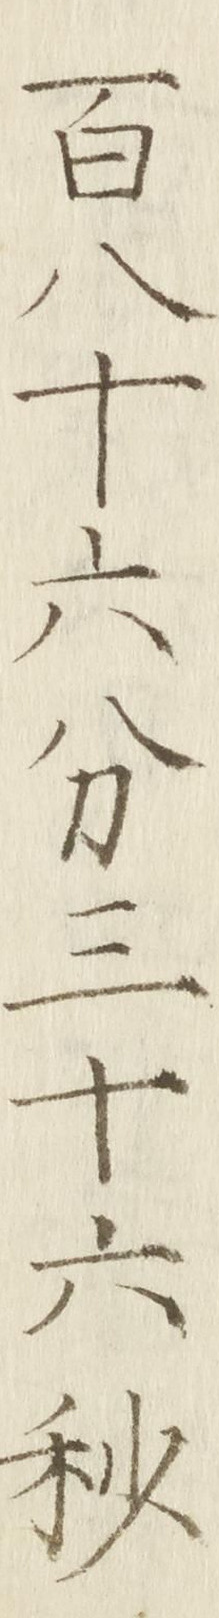百八十六分三十六秒
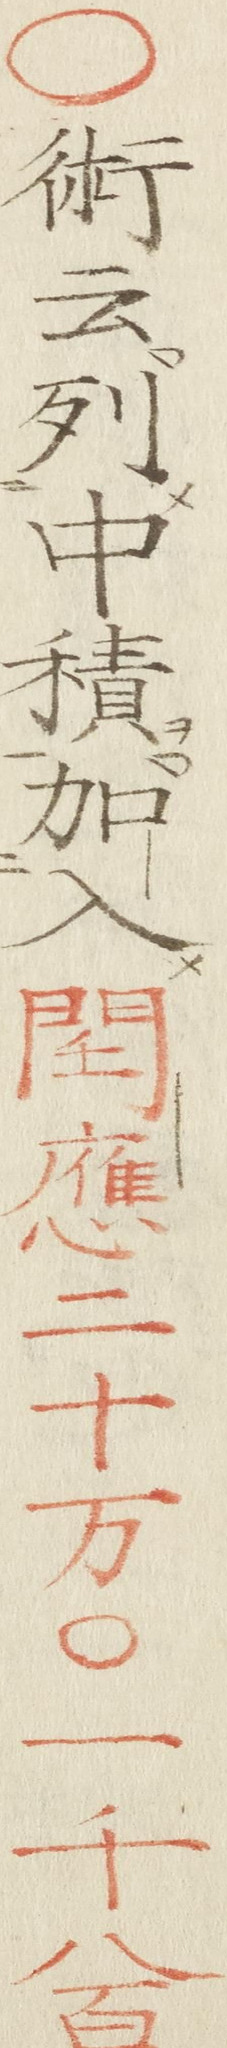〇術云列中積。加入閏応二十万〇一千八百
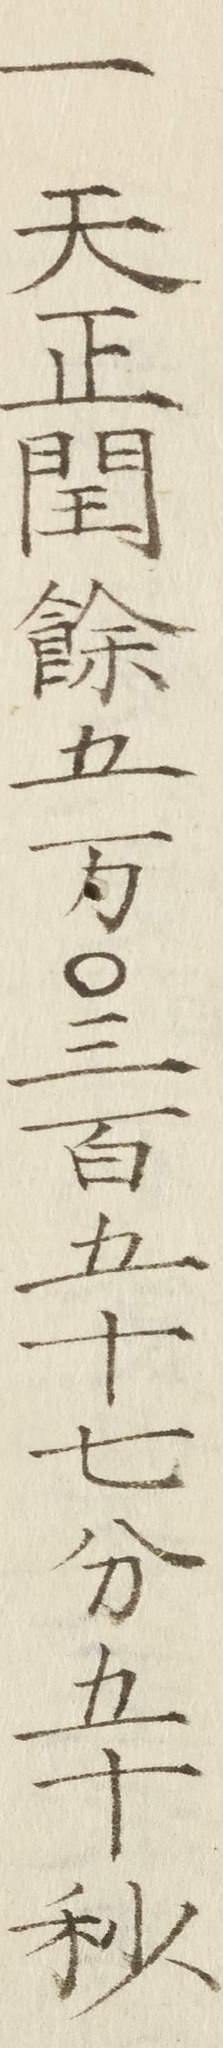一天正閏余五万〇三百五十七分五十秒
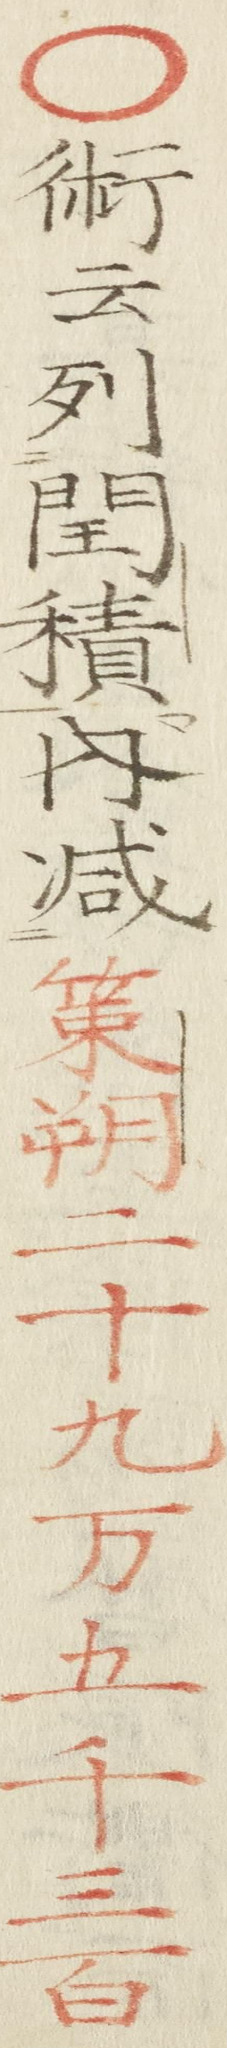〇術云列閏積。内減策朔二十九万五千三百
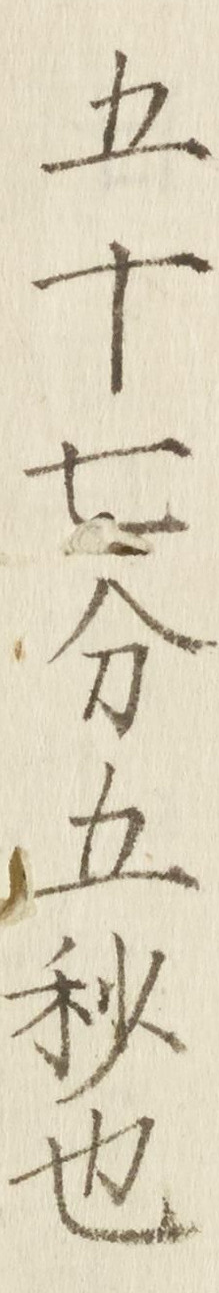五十七分五秒也

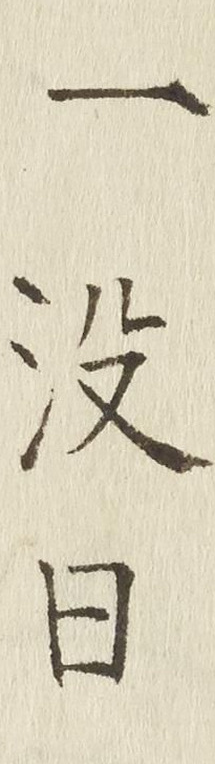一没日
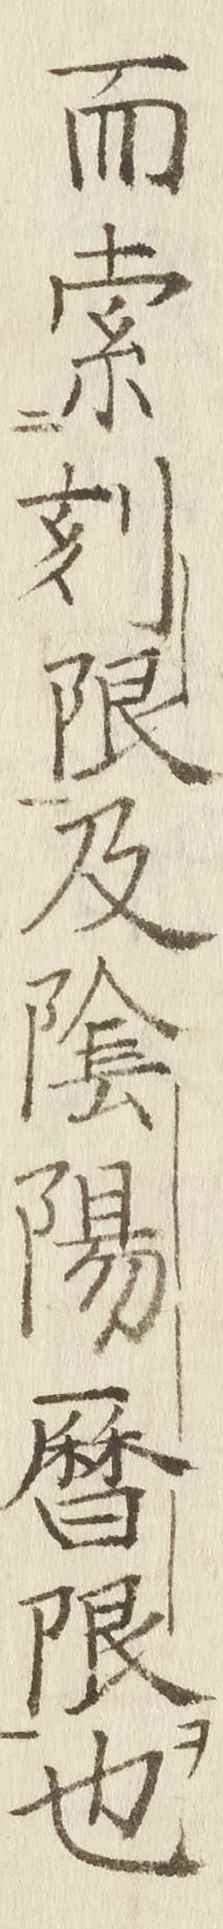而索刻限及陰陽暦限也
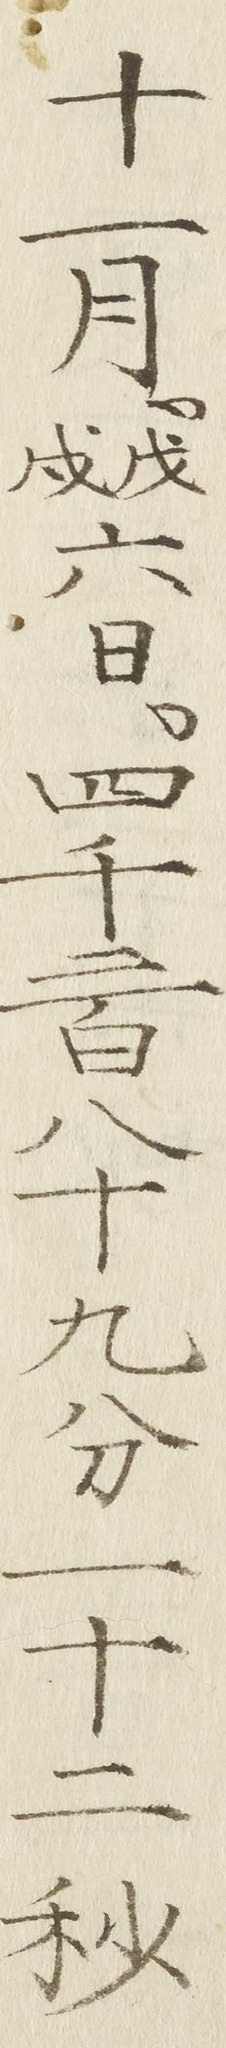十一月。戊戌六日。四千二百八十九分一十二秒
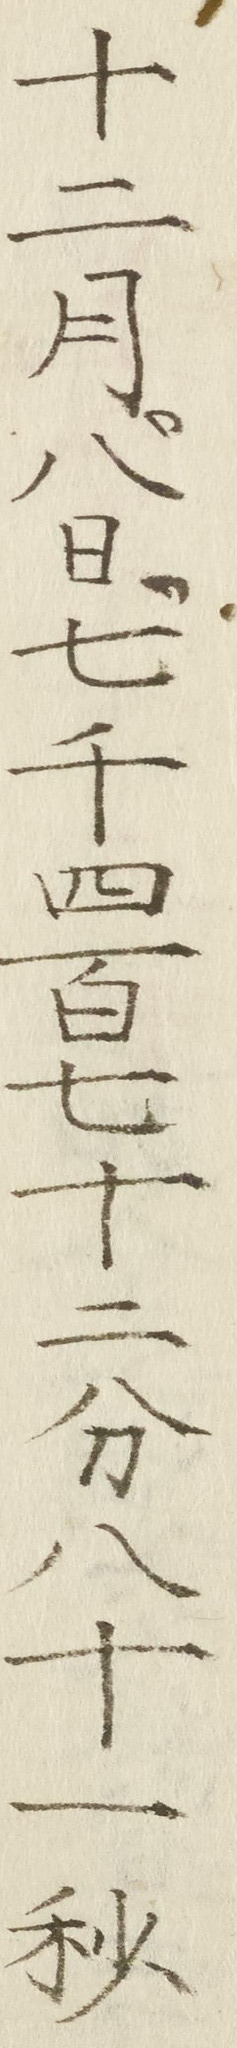十二月。八日。七千四百七十二分八十一秒
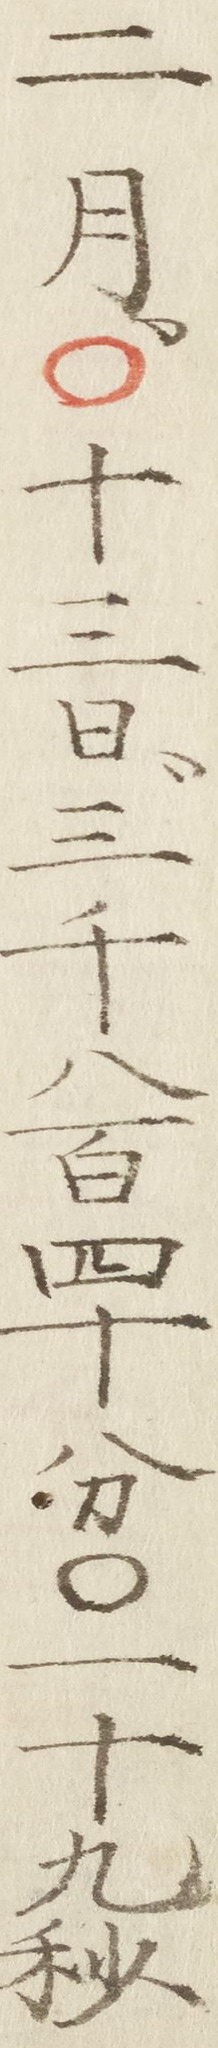二月。○十三日。三千八百四十分〇一十九秒
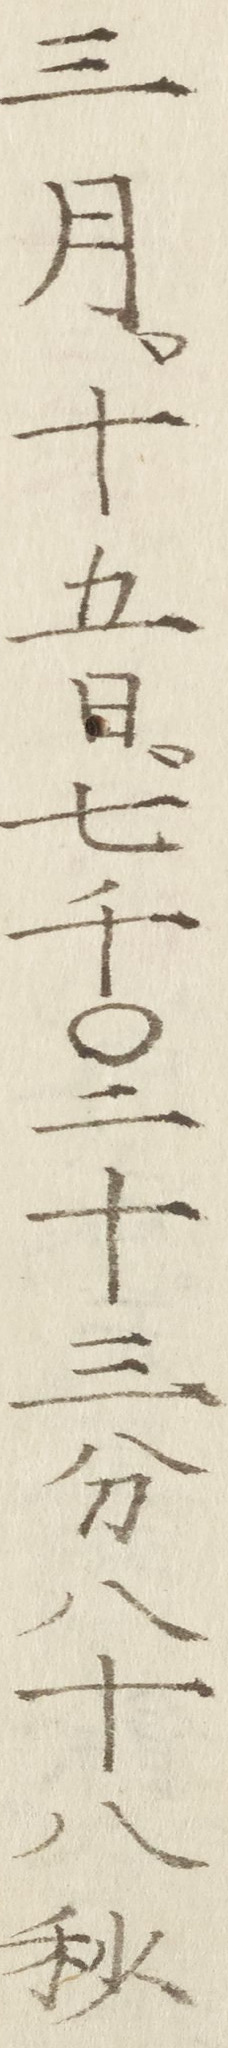三月。十五日。七千〇二十三分八十八秒
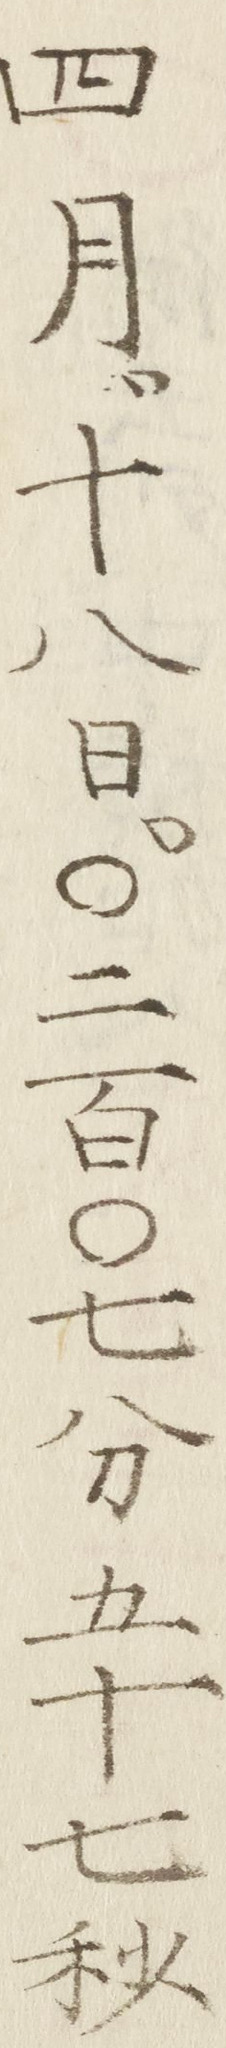四月。十八日。〇二百〇七分五十七秒
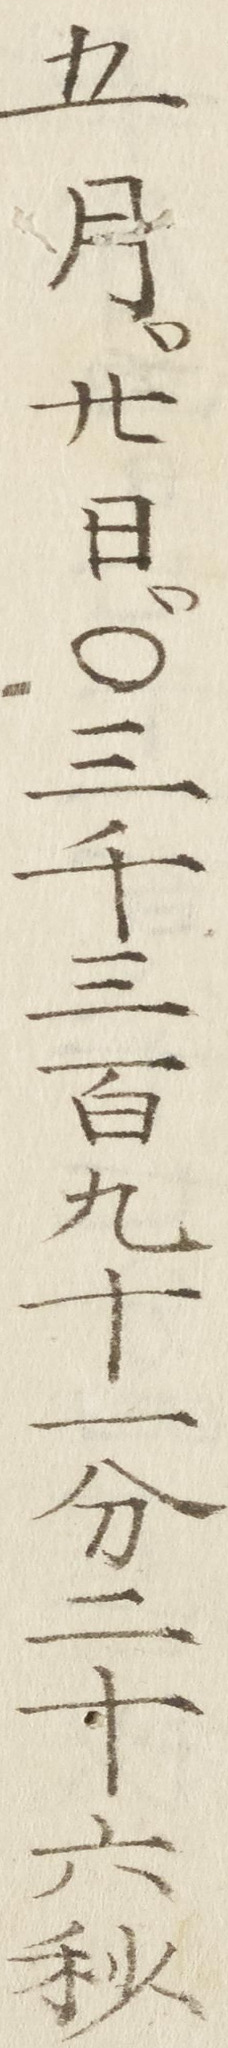五月。廿日。〇三千三百九十一分二十六秒
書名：日食度
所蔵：東京大学地震研究所図書室 Earthquake Research Institute Library, The University of Tokyo, JAPAN
